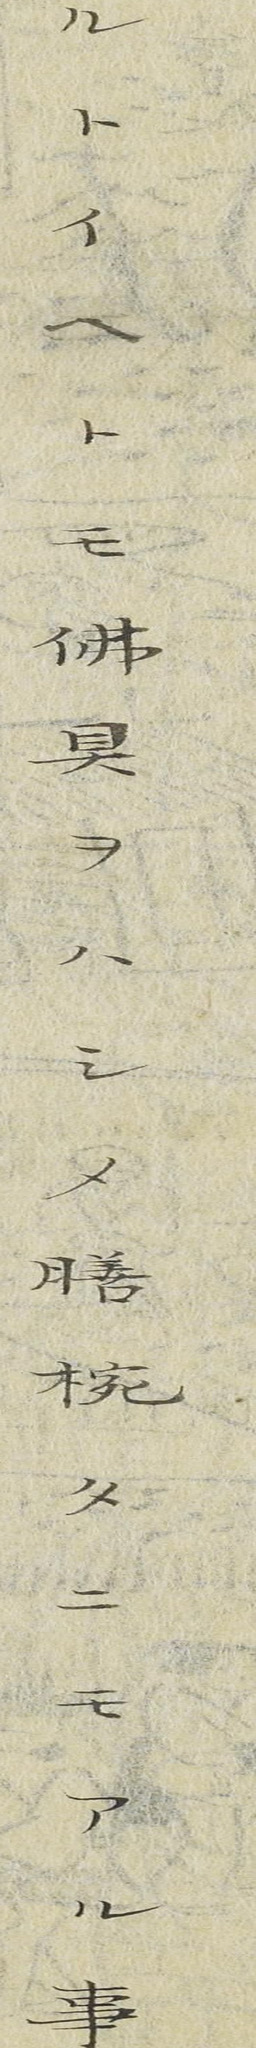ルトイヘトモ仏具ヲハシメ膳椀タニモアル事
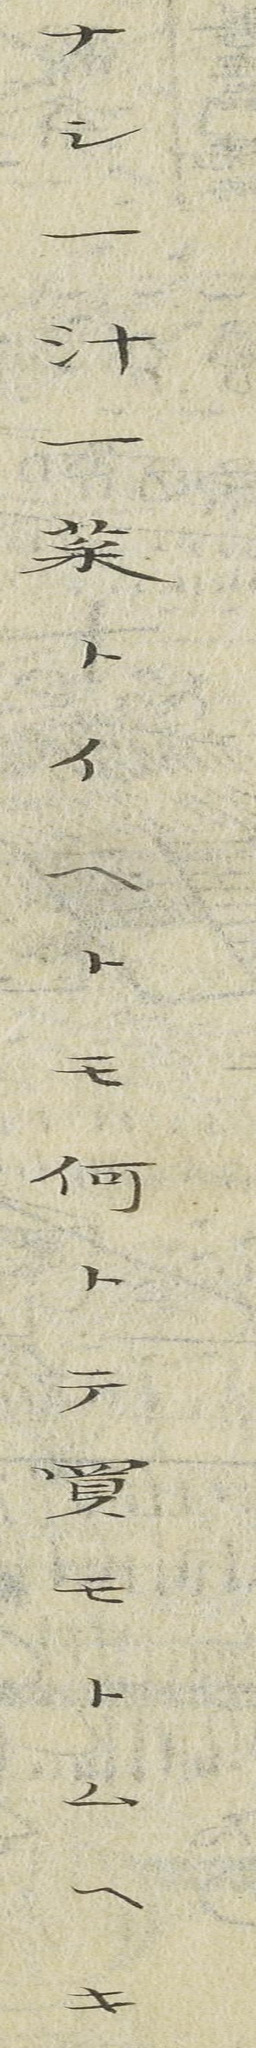ナシ一汁一菜トイヘトモ何トテ買モトムヘキ
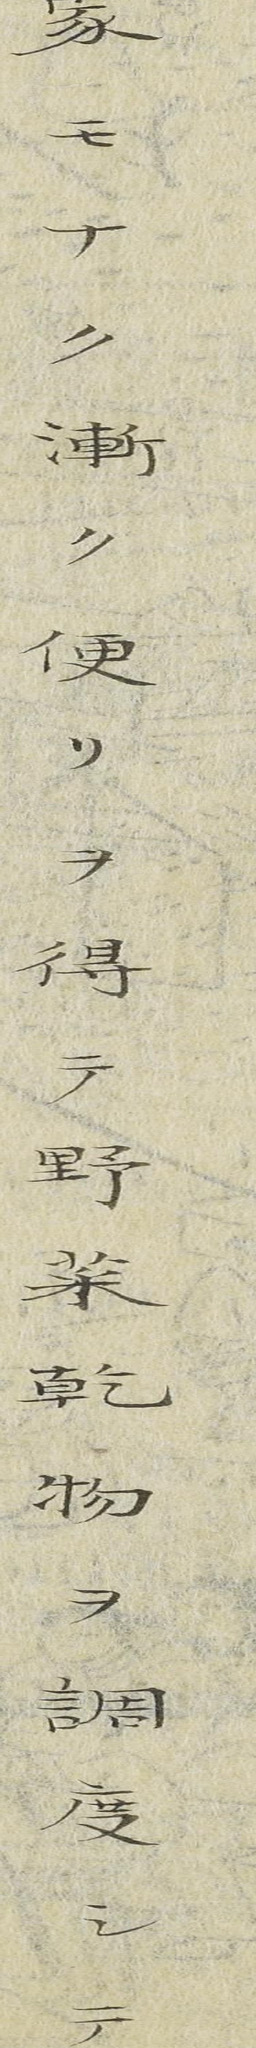家モナク漸ク便リヲ得テ野菜乾物ヲ調度シテ
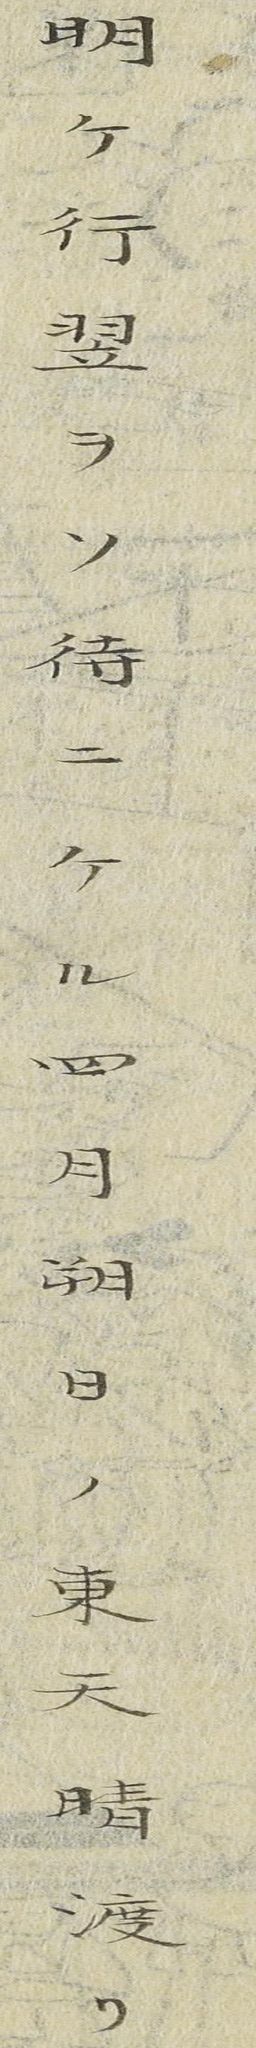明ケ行翌ヲソ待ニケル四月朔日ノ東天晴渡リ
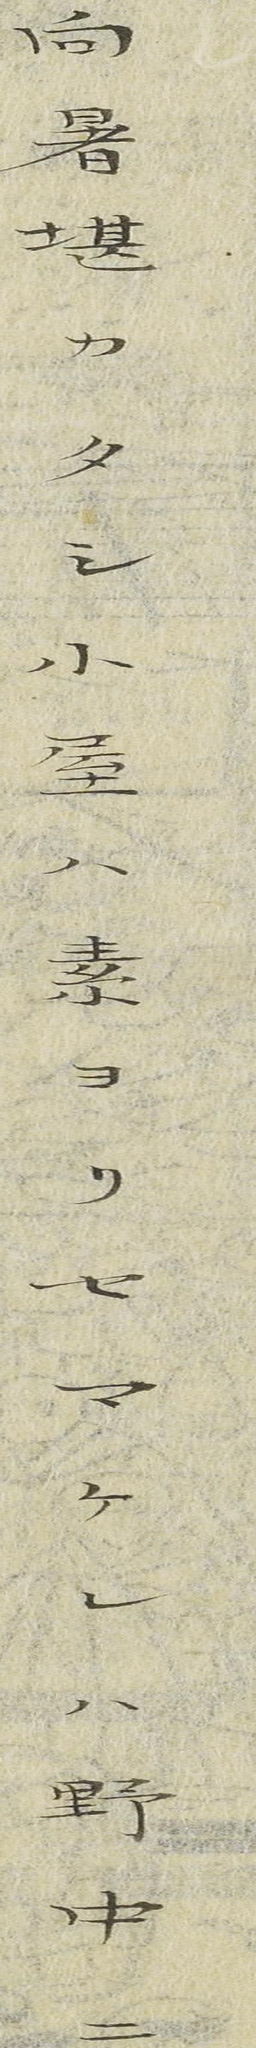向暑堪カタシ小屋ハ素ヨリセマケレハ野中ニ
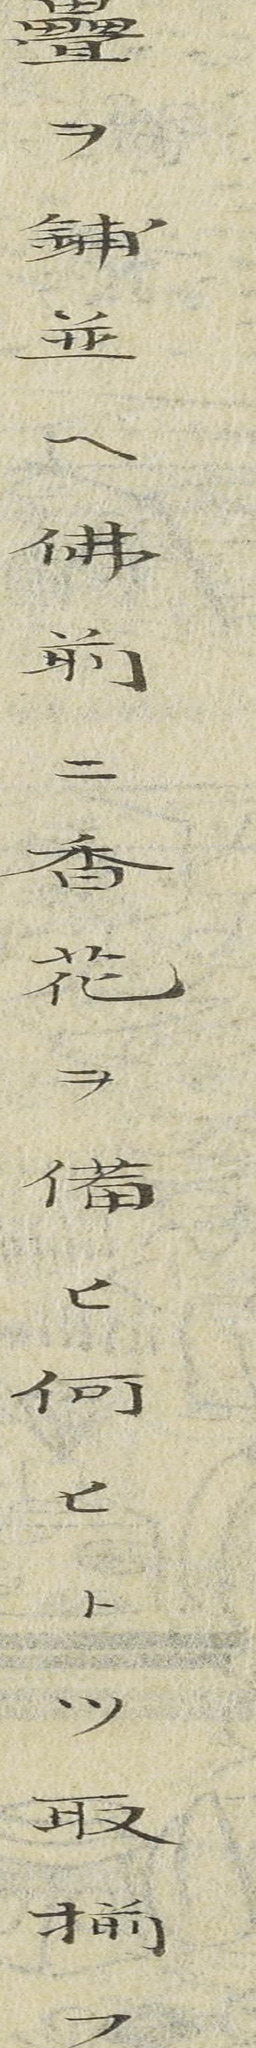畳ヲ鋪並ヘ仏前ニ香花ヲ備ヒ何ヒトツ取揃フ
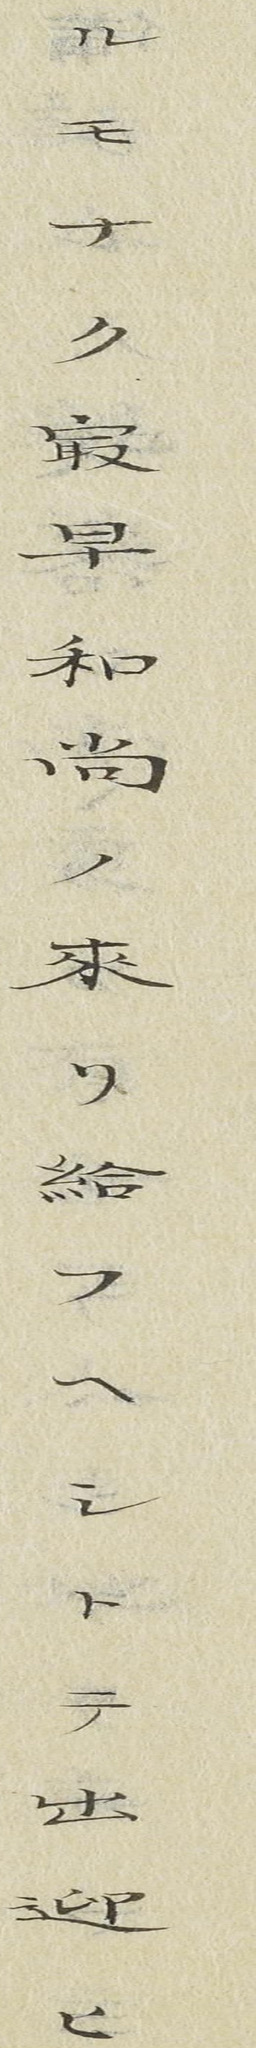ルモナク最早和尚ノ来リ給フヘシトテ出迎ヒ
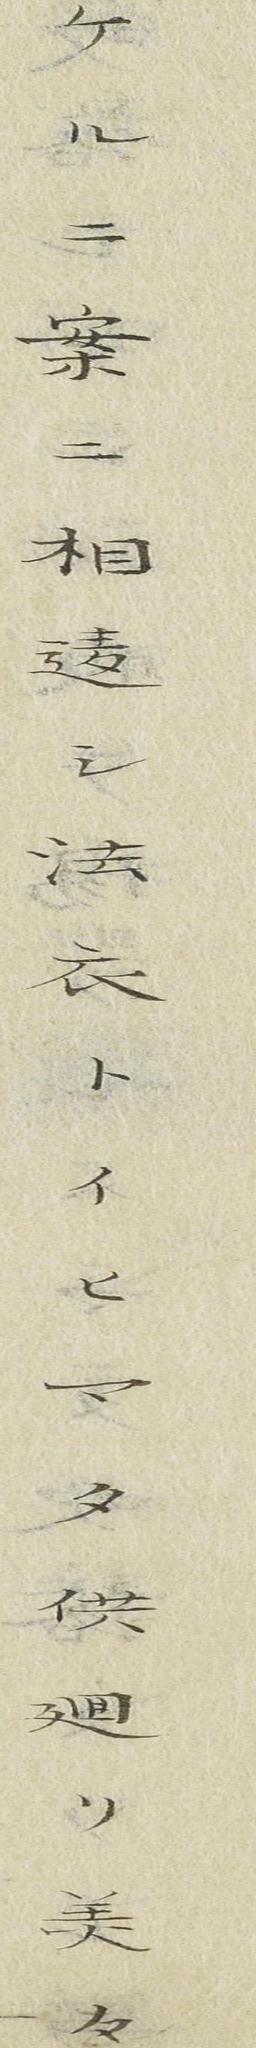ケルノ案ニ相違シ法衣トイヒマタ供廻リ美々
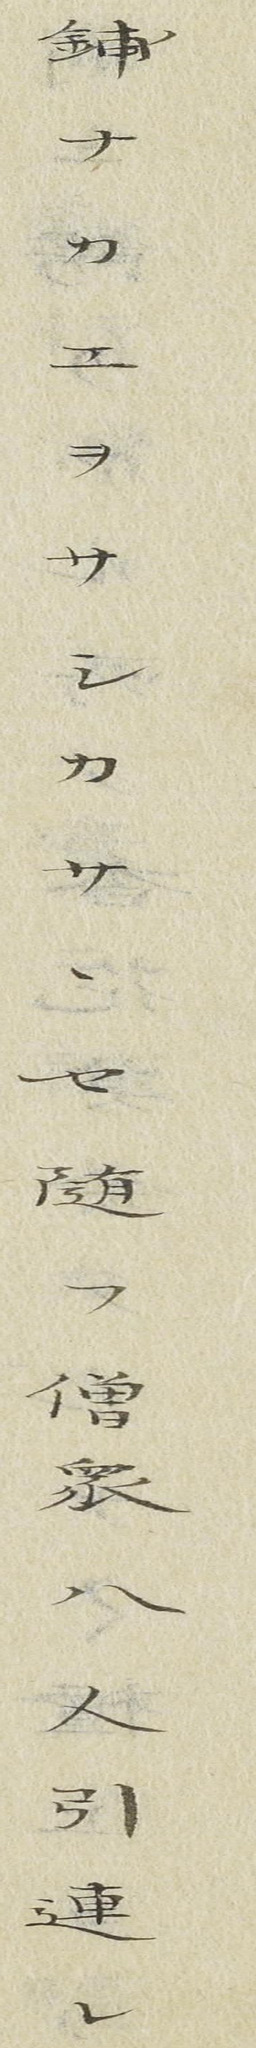鋪ナカエヲサシカサヽセ随フ僧衆八人引連レ
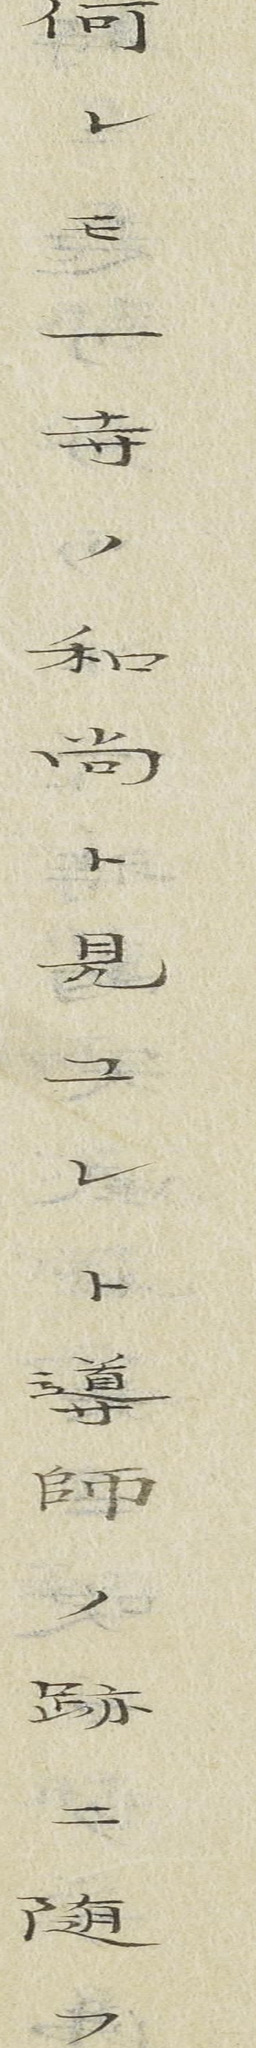何レモ一寺ノ和尚ト見ユレト導師ノ跡ニ随フ
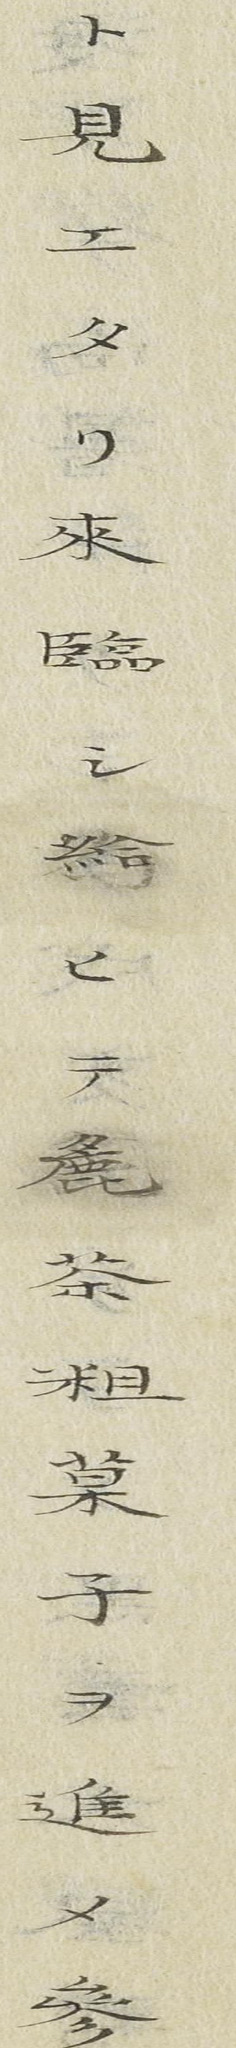ト見エタリ来臨シ給ヒテ麁茶粗菓子ヲ進メ参
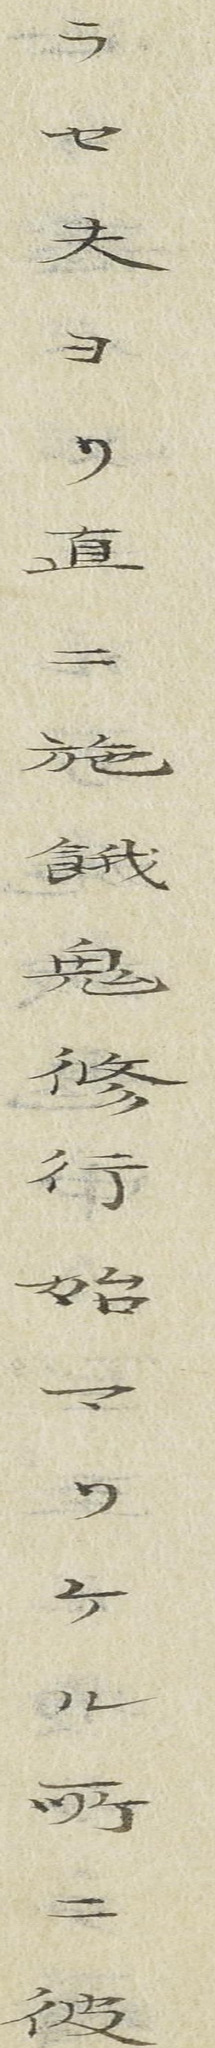ラセ夫ヨリ直ニ施餓鬼修行始マリケル所ニ彼
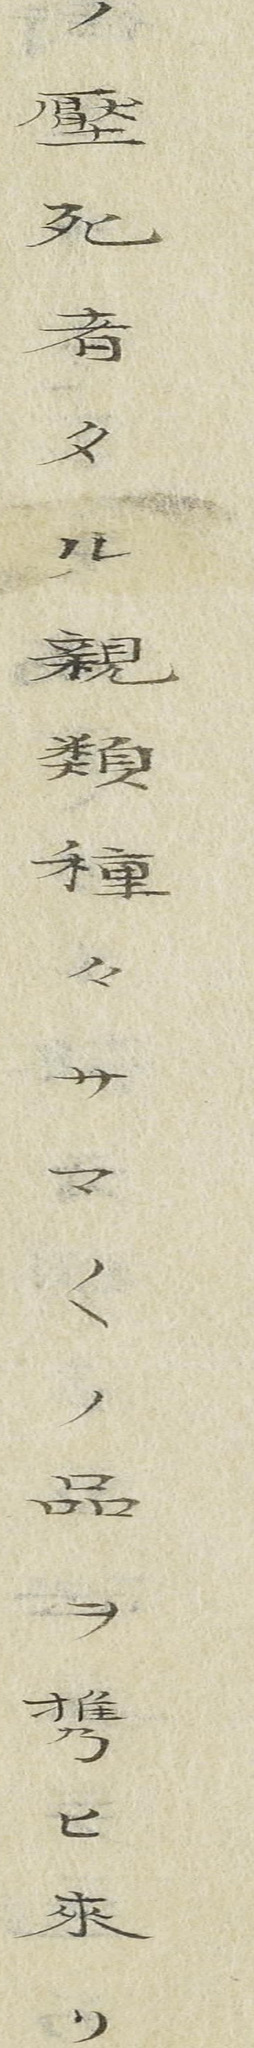ノ圧死者タル親類種々サマ〱ノ品ヲ携ヒ来リ
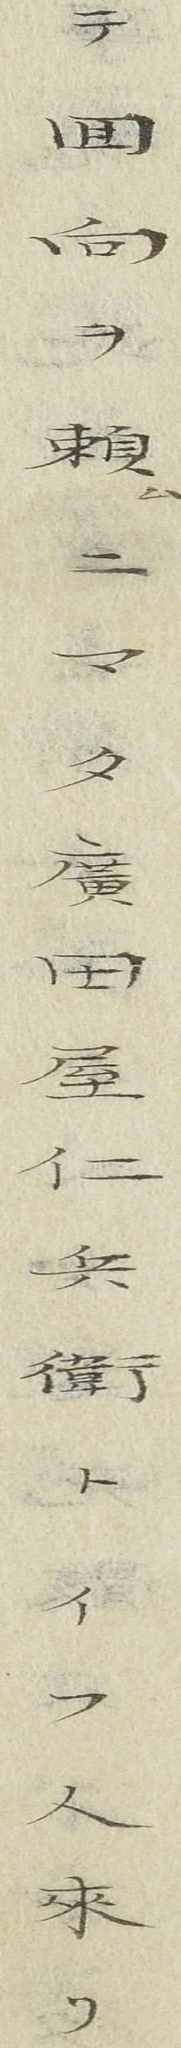テ回向ヲ頼ムニマタ広田屋仁兵衛トイフ人来リ
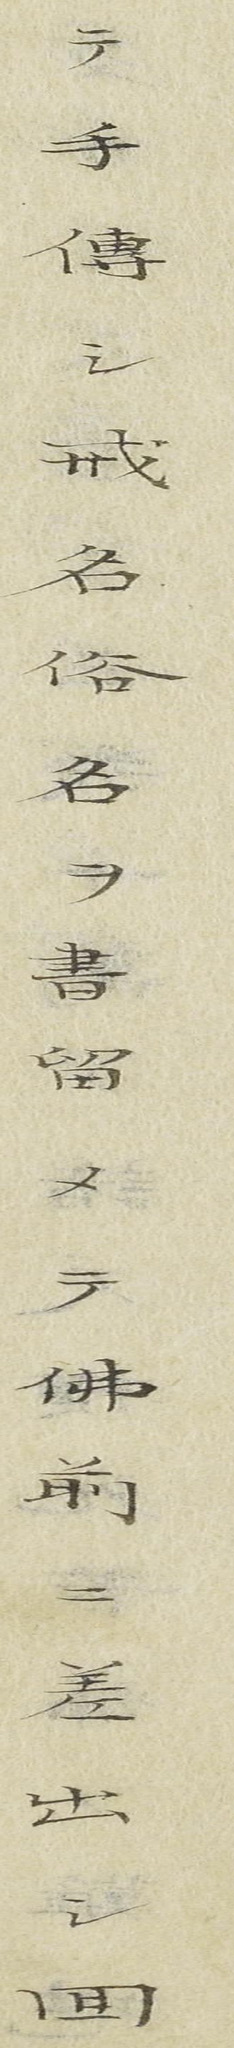テ手伝シ戒名俗名ヲ書留メテ仏前ニ差出シ回
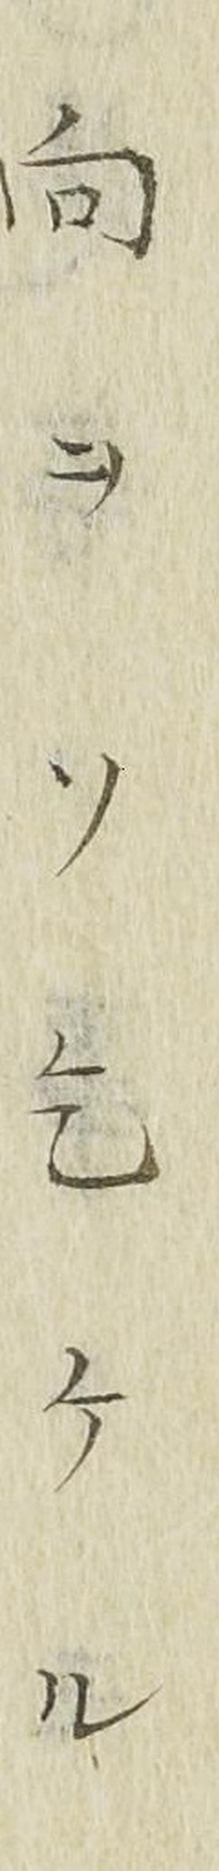向ヲソ乞ケル
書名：地災撮要　地震之部　巻ノ二
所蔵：東京大学地震研究所図書室 Earthquake Research Institute Library, The University of Tokyo, JAPAN
